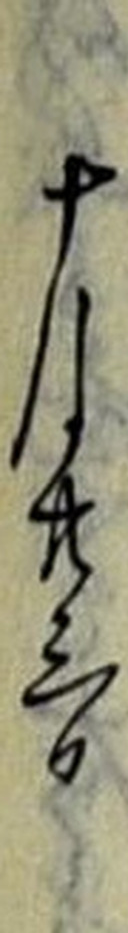十月廿三日
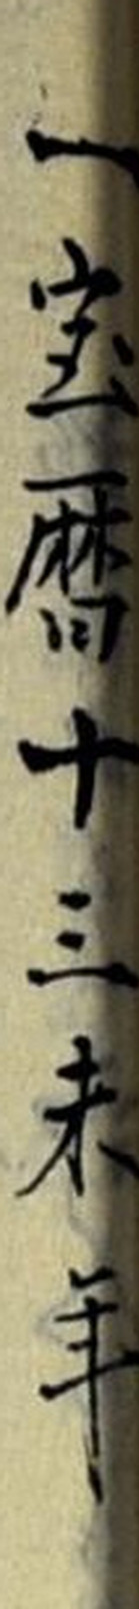一宝暦十三未年
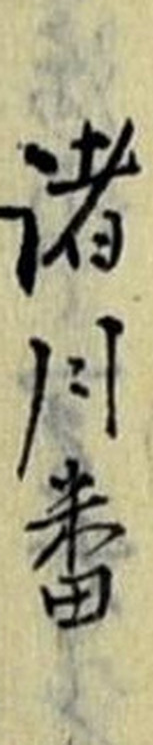諸月番
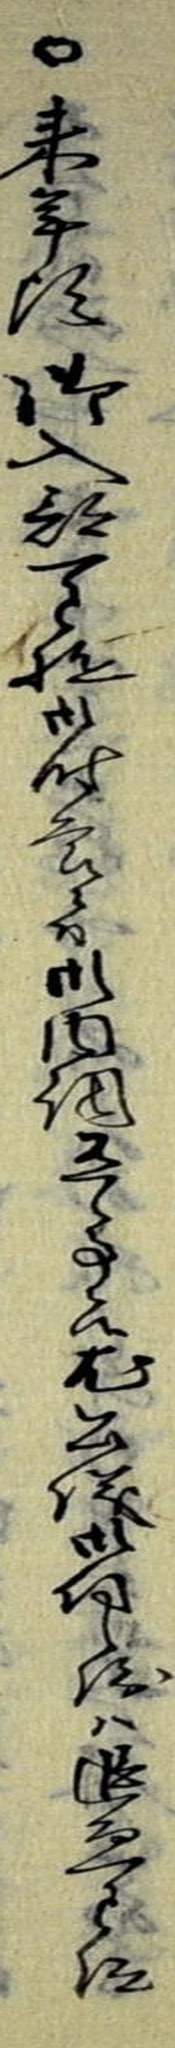〇来年頃御入部可被遊御時節に付御内伺有之事に候尤公儀御伺之儀は追而可被仰
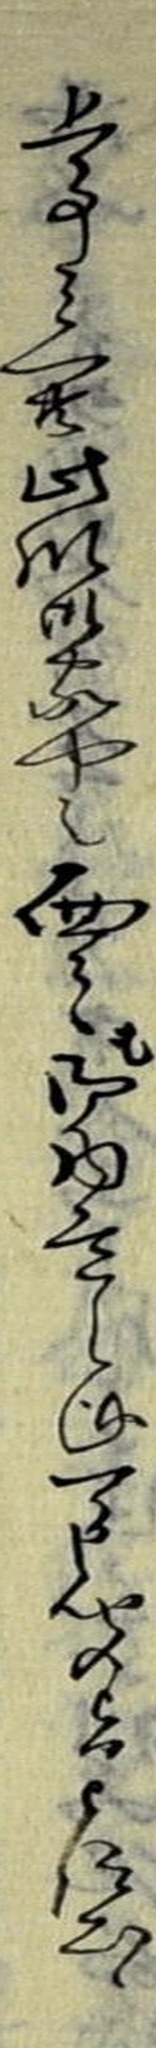上事に候へ共此段御家中之面々へも御内意之趣可申聞旨被仰出候
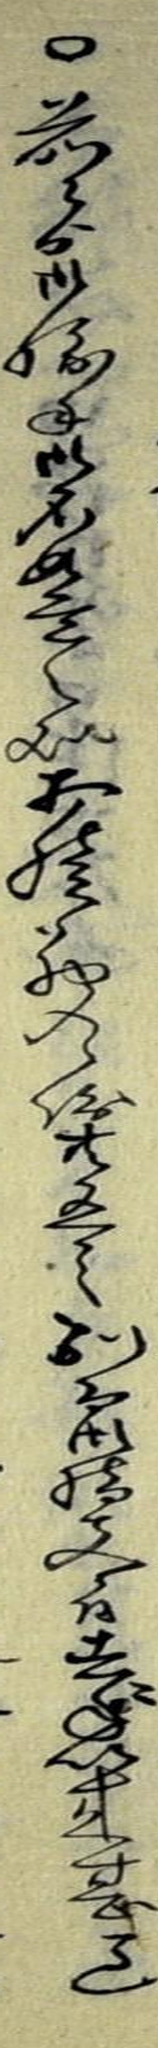〇前々ゟ御勝手御不如意之処相続御物入之儀共有之別而御指支に付去々年以来甚過
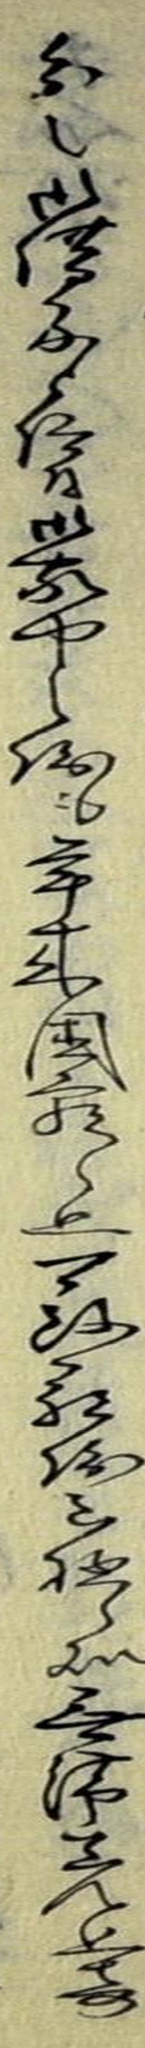分之御借米被仰付御家中之儀も年来困窮之上可致難儀至極之処無滞差上寄
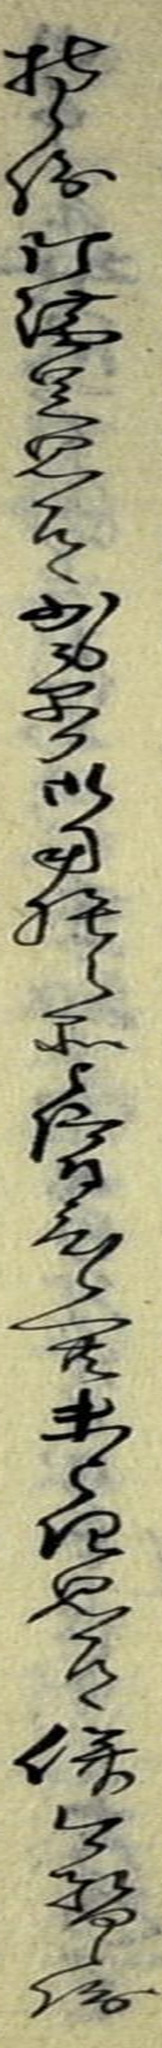特之儀御満足思召候少も早く御用捨之品被仰付度候へ共未被任思召候併今暫之儀
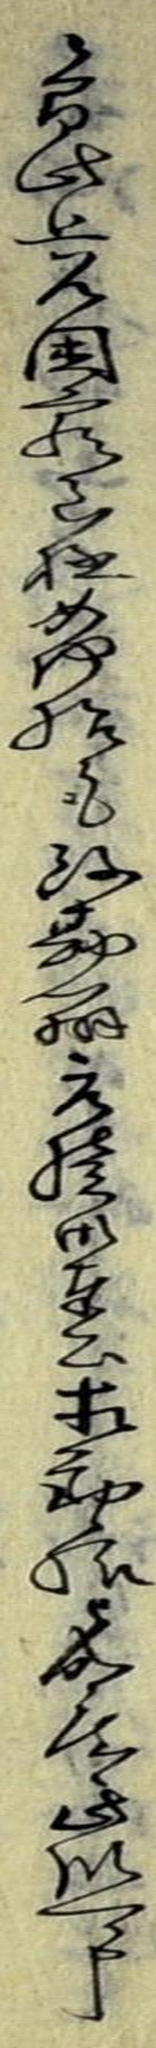候間此上乍困窮至極如何様にも致勘弁取続御奉公相勤候様被成度候此段可申
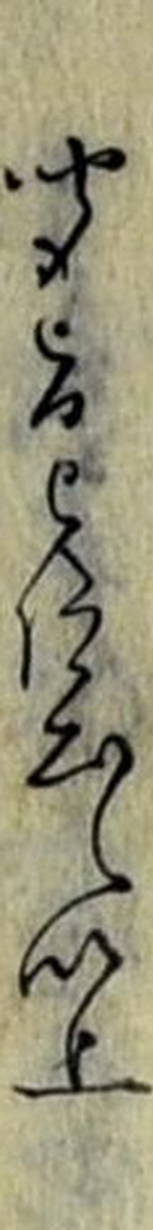聞旨被仰出候以上
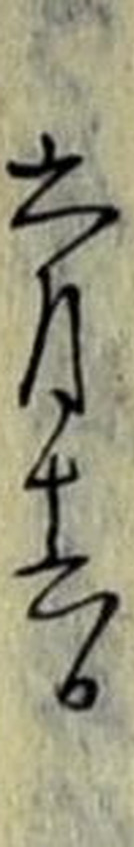六月十六日
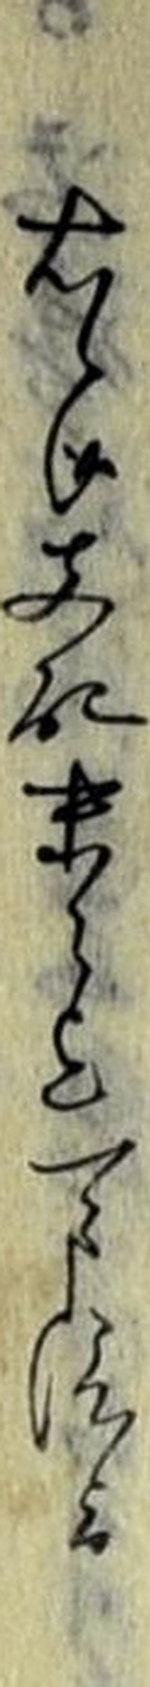右之趣支配末々迄可申渡旨
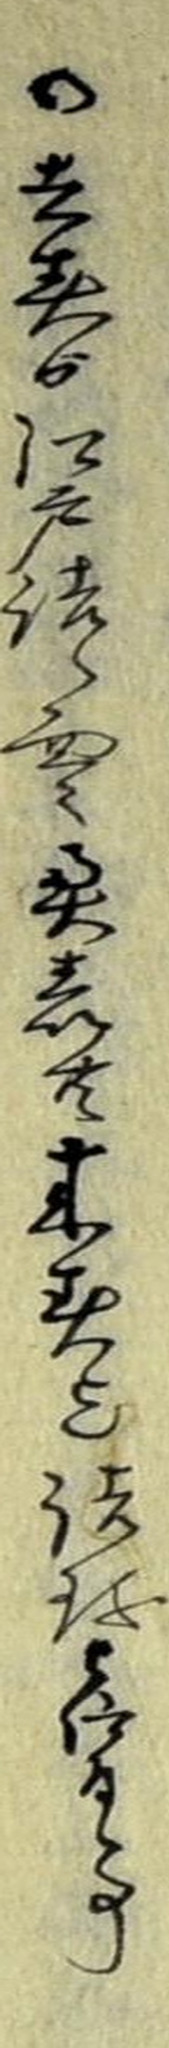〇去春ゟ江戸詰之面々奥表共来春迄詰致被仰付候事
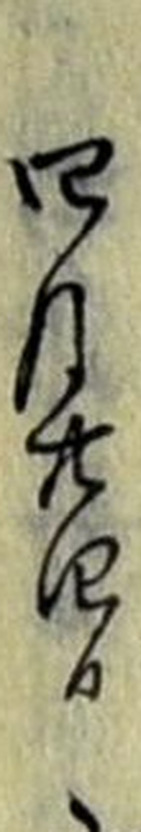五月廿八日
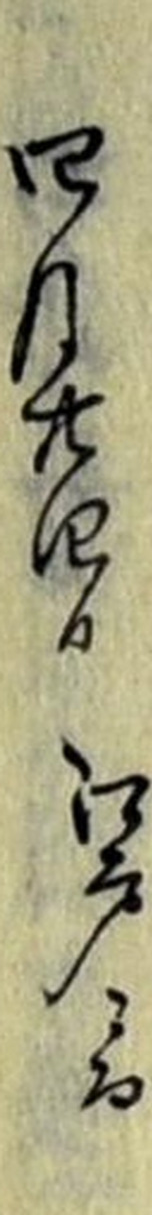四月廿四日江戸に而

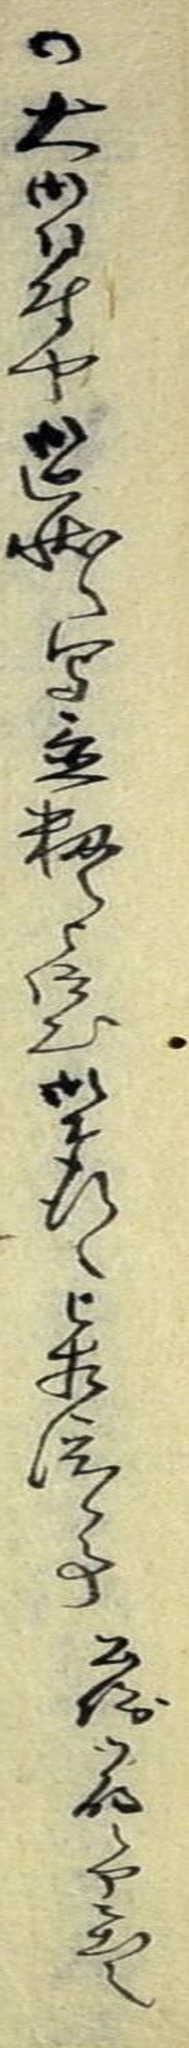〇大御目付中御廻状之写置籾之被仰出御奉行へ被相渡候事公儀御触之部に出之
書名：命令之部 二
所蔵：福井県文書館 Fukui Prefectural Archives
